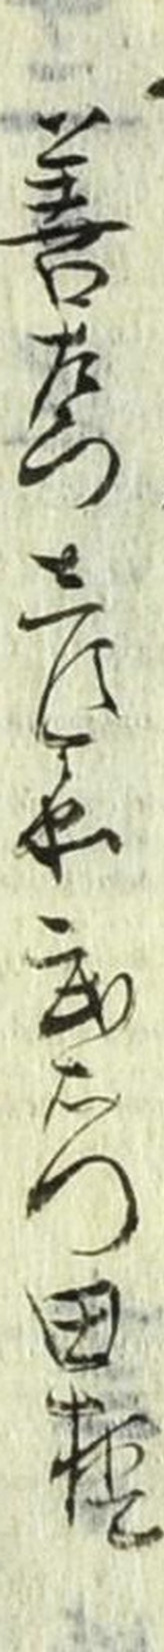善左衛門彦兵衛武右衛門田植
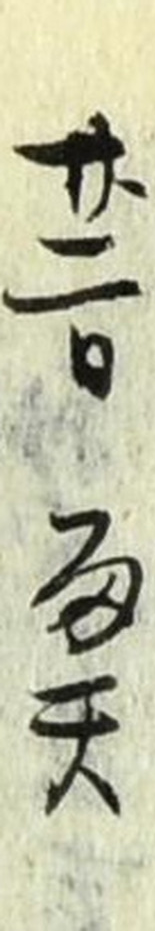廿二日雨天
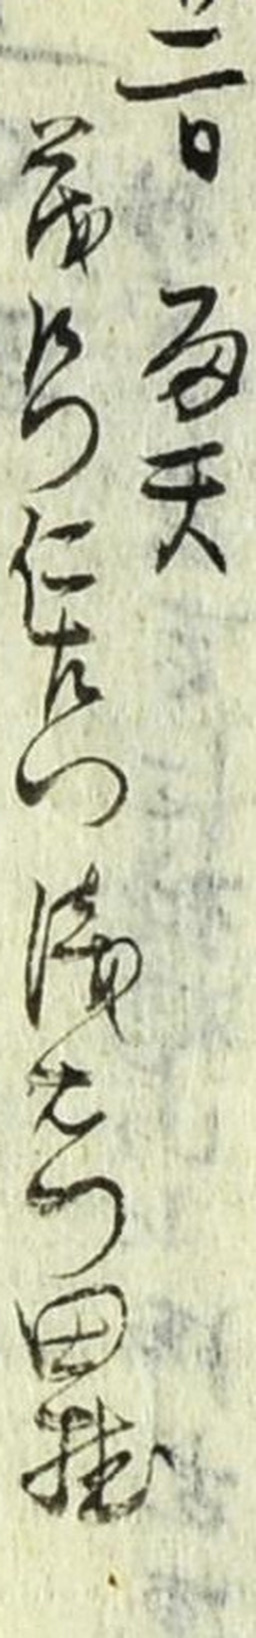茂左衛門仁左衛門浅右衛門田植
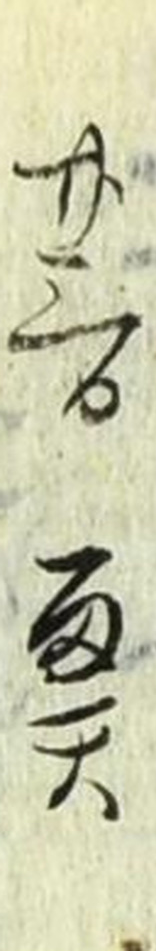廿三日雨天
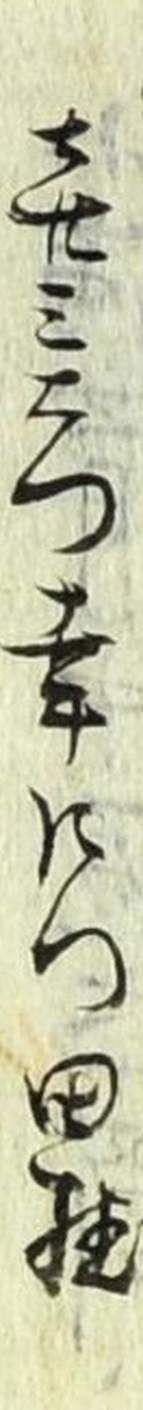喜三右衛門幸左衛門田植
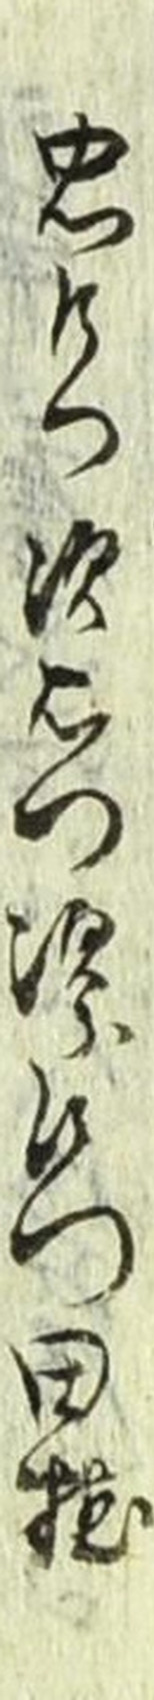忠左衛門次右衛門次郎左衛門田植
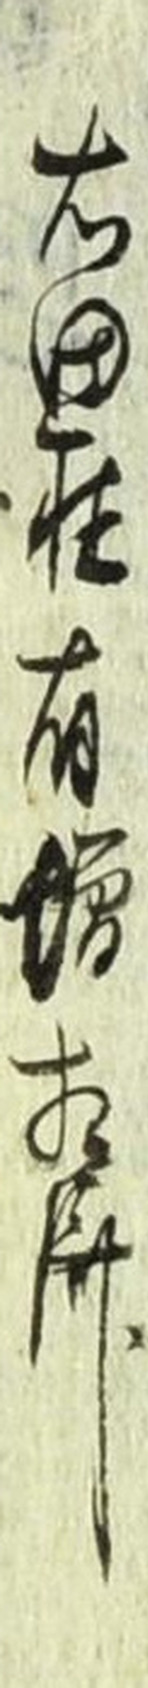右田植有増相済
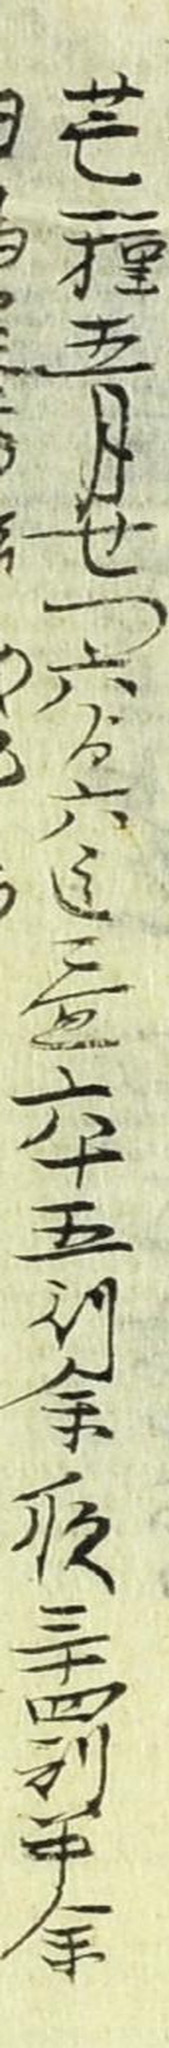芒種五月せつ六ゟ六迄昼六十五刻余夜三十四刻半余
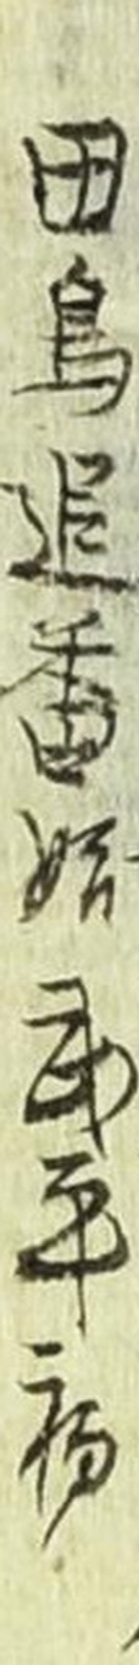田鳥追番始武平初
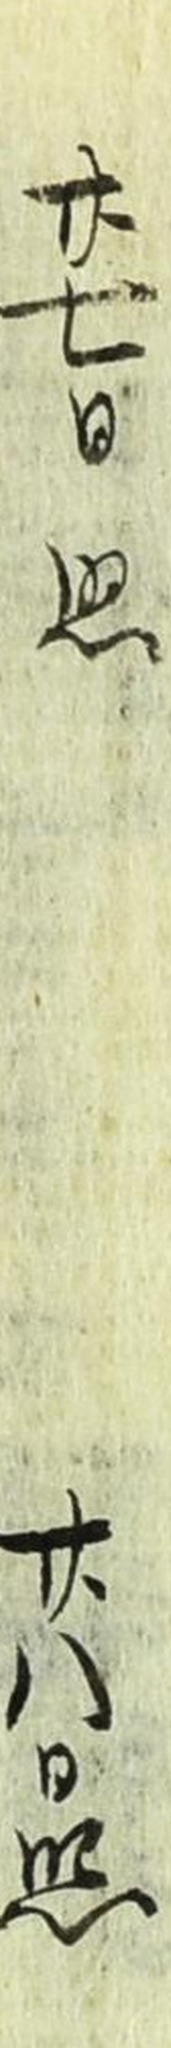廿七日照廿八日照
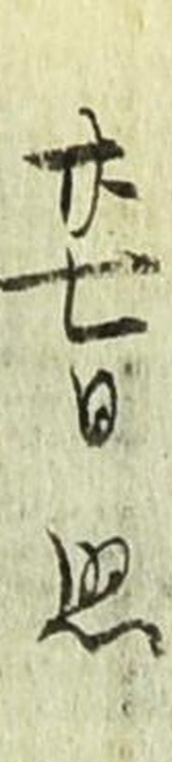廿九日照
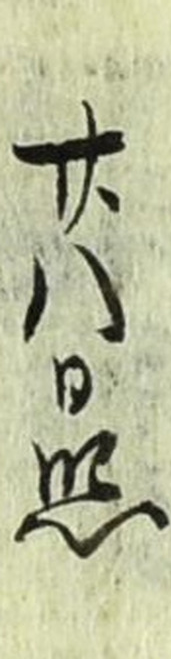十八日照
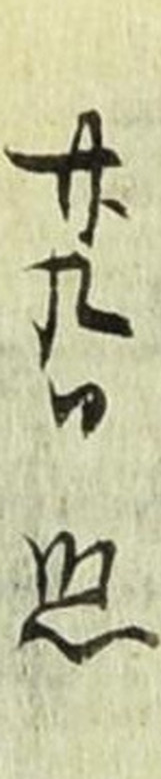廿九日照

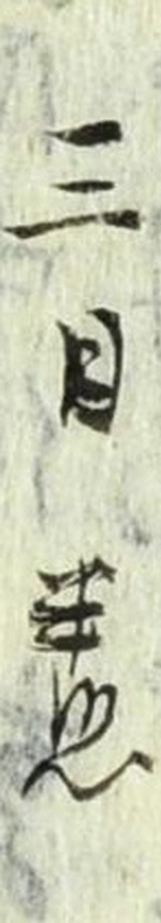八日照
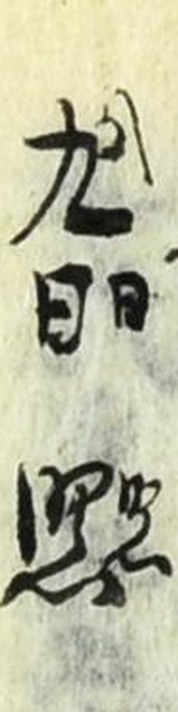八日照
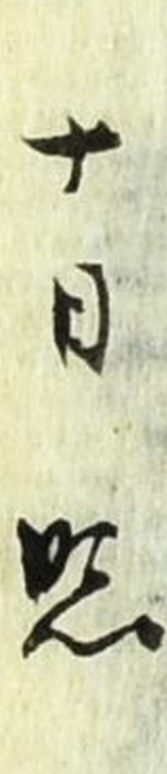八日照
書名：（日記）
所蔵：福井県文書館 Fukui Prefectural Archives
